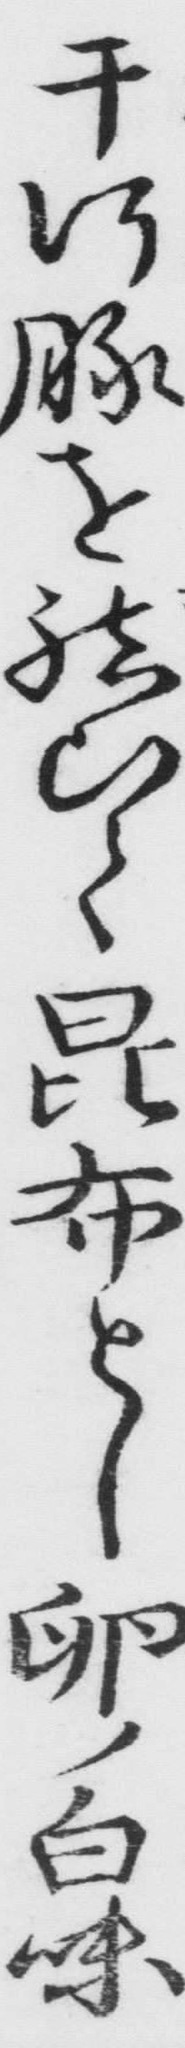干河豚を結ひて昆布とし卵の白味
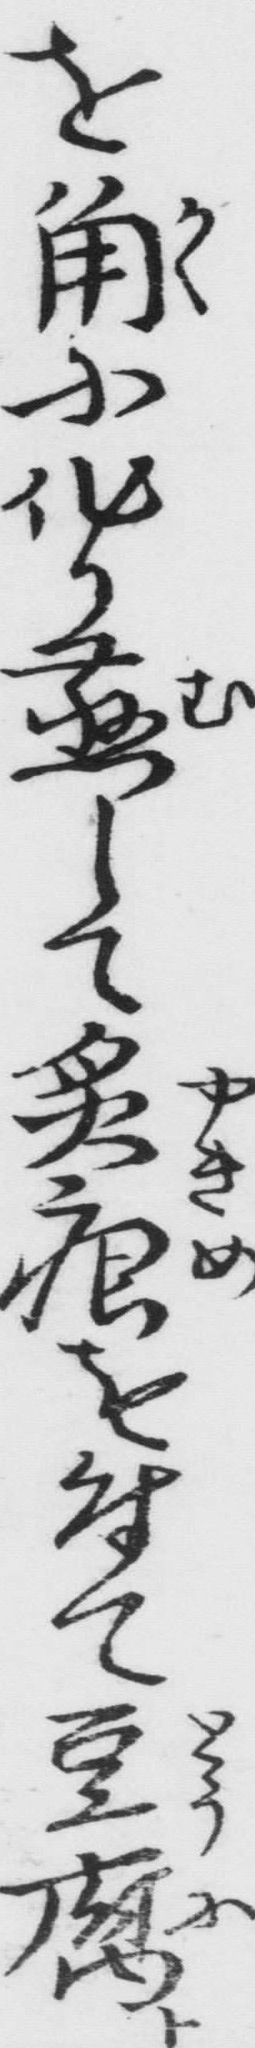を角に作り蒸して炙痕を付て豆腐と
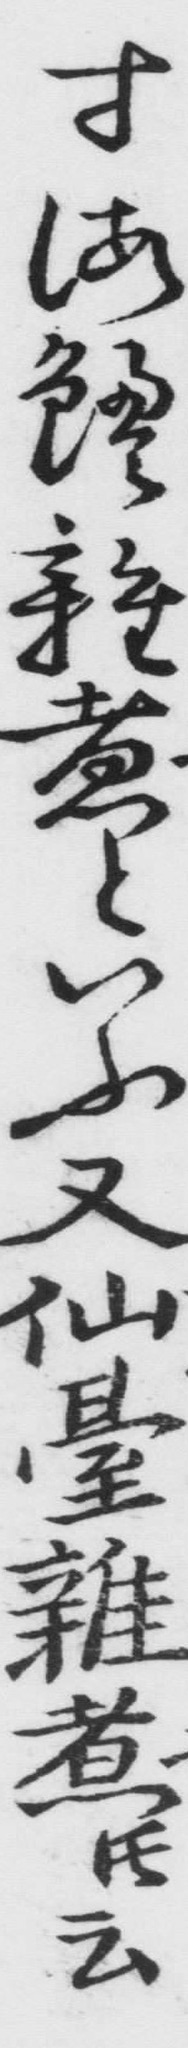す海鱧雑煮といふ又仙臺雑煮とも云

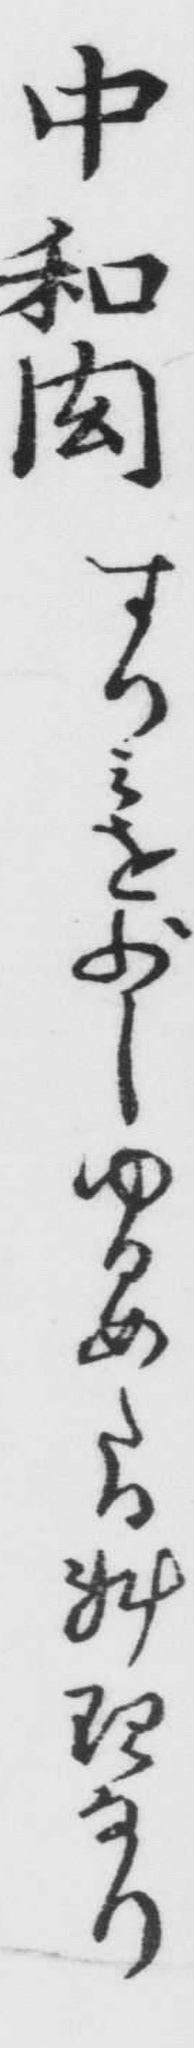中和肉すりみを少しゆるめたる料理なり
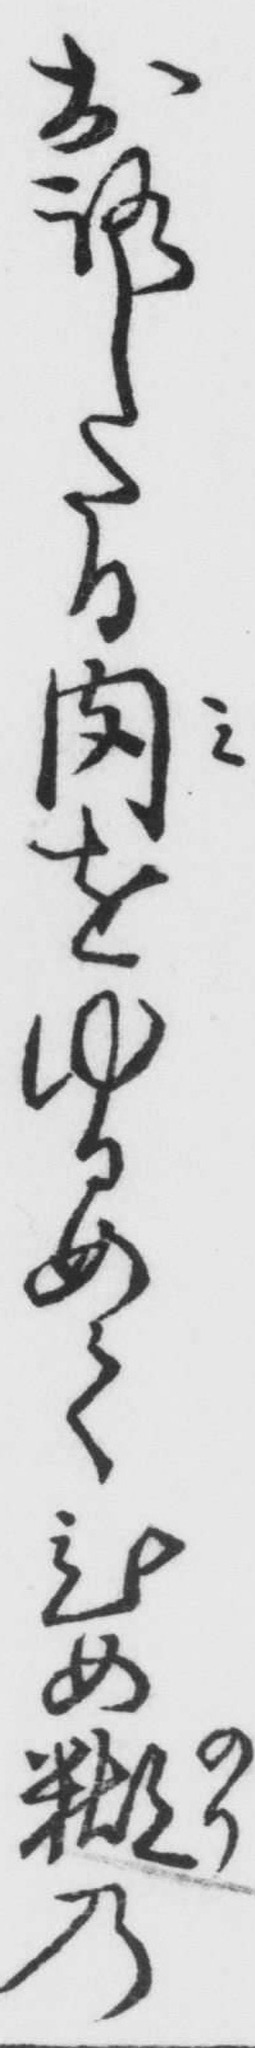おろしたる肉をゆるめてひめ糊の
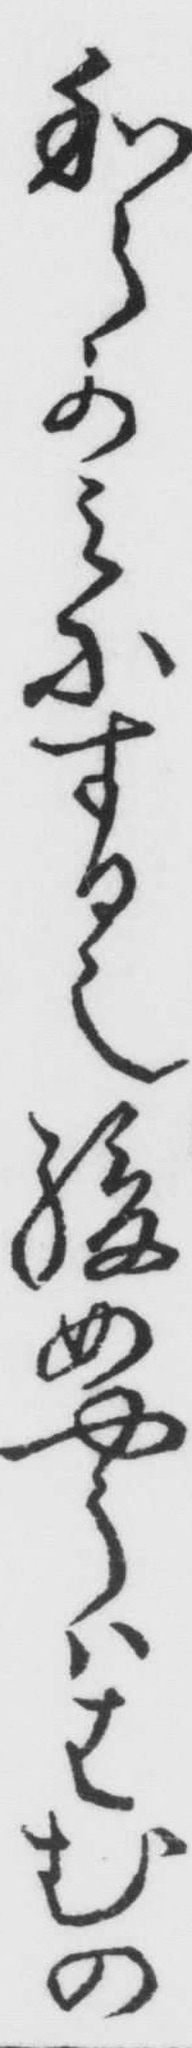和らかみにする也緩めやうははむの
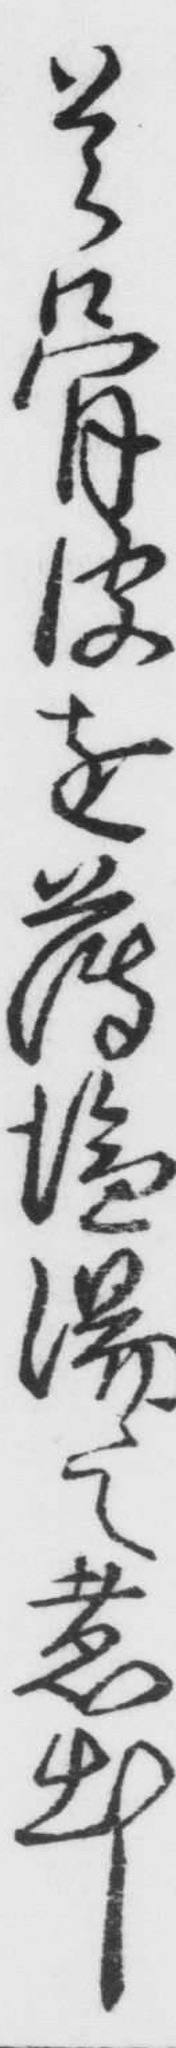首骨皮を薄塩湯て煮出し
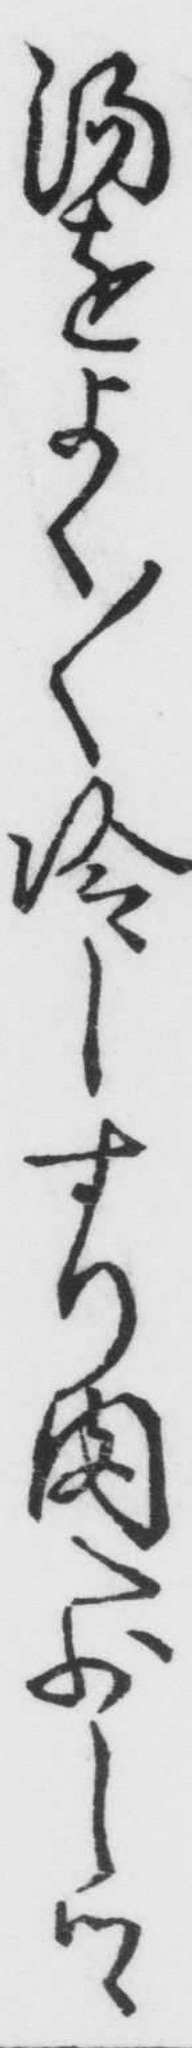湯をよく〳〵冷しすり肉へ少しつゝ
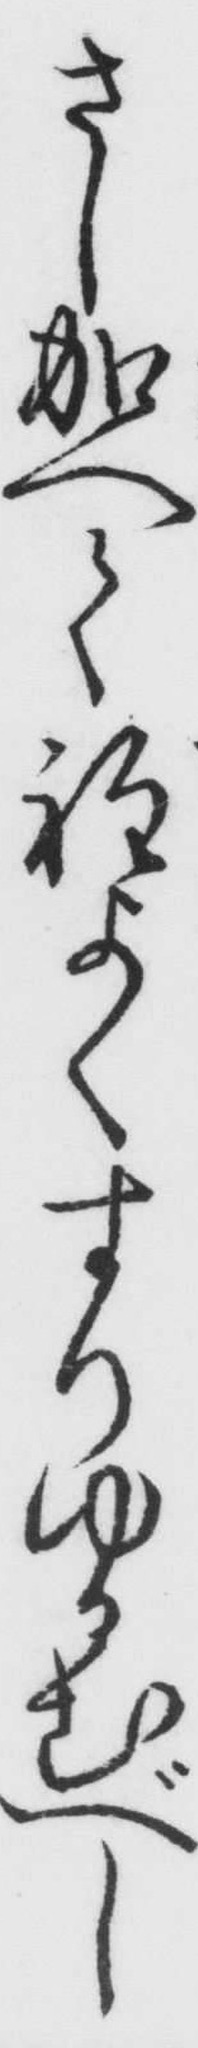さし加へて程よくすりゆるむべし
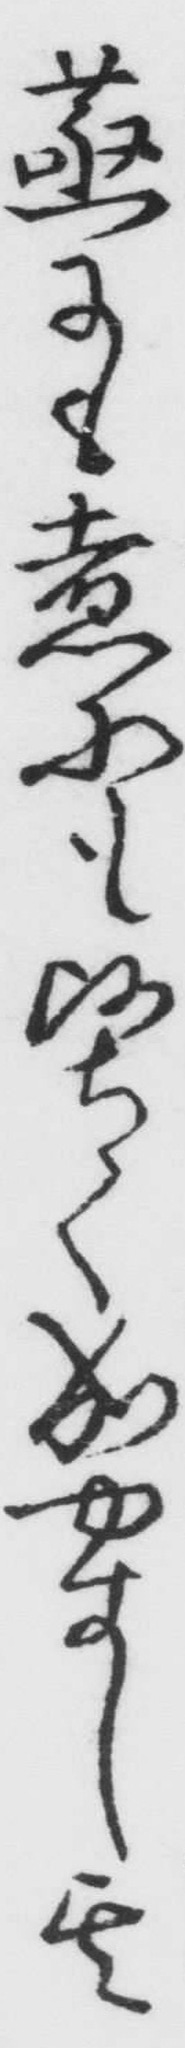蒸にも煮にも堅く成やすし其

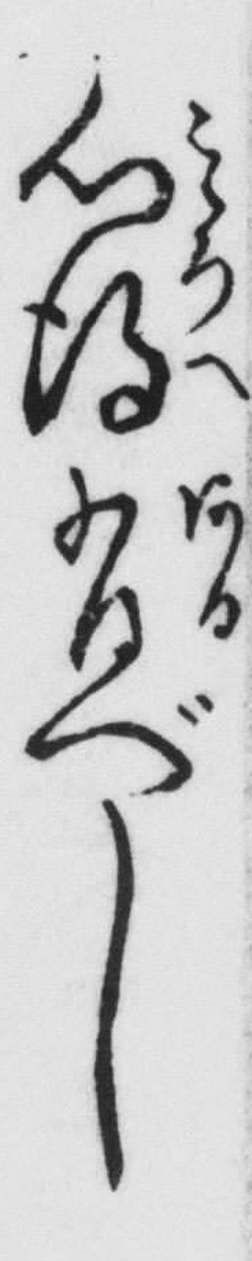心得有べし
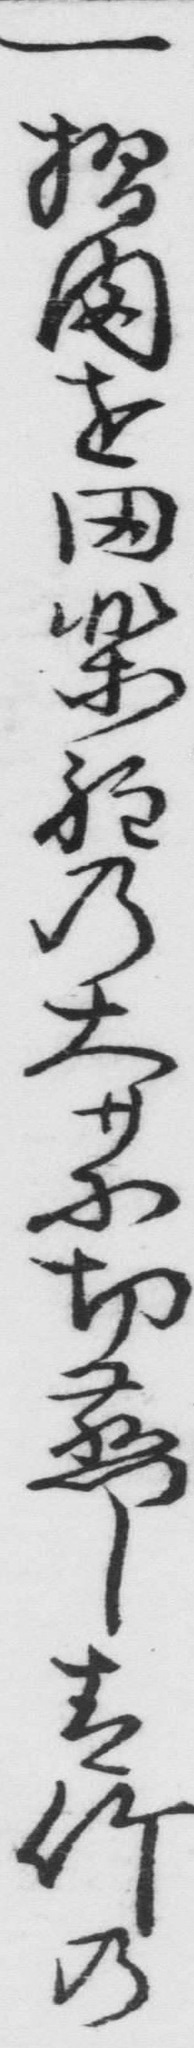一摺肉を田楽程の大さに切蒸し青竹の
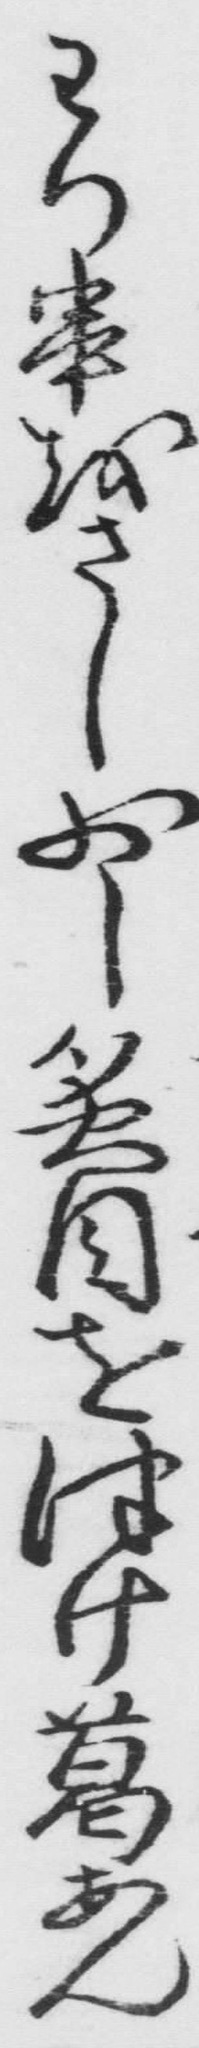わり串をさし少し炙目をつけ葛あん
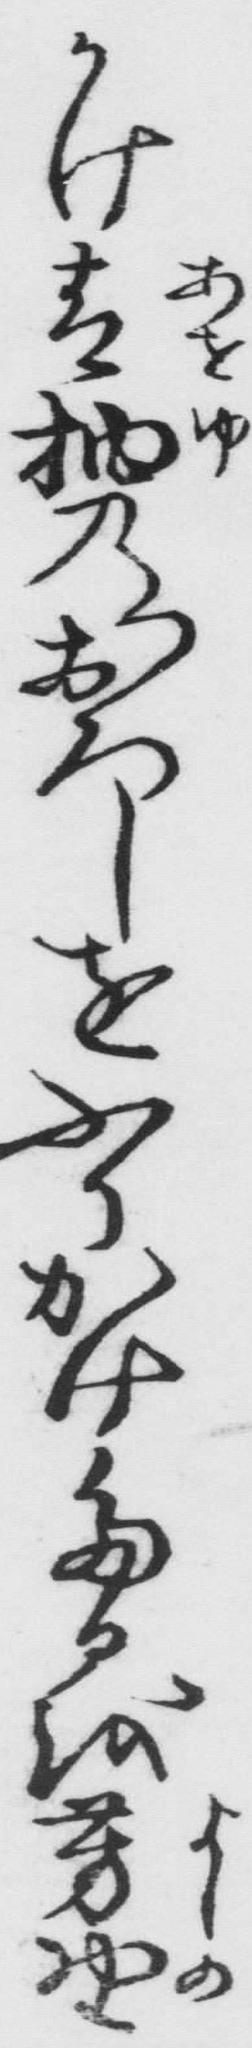かけ青柚のおろしをふりかけたるを芳野
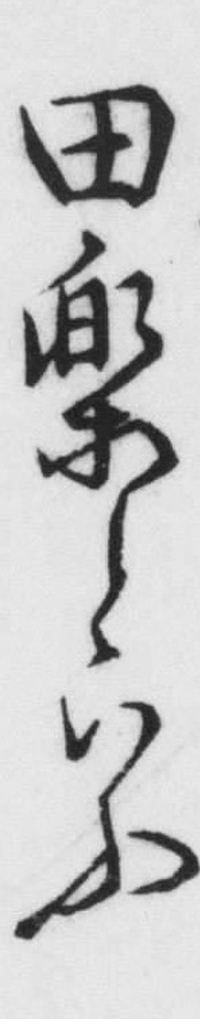田楽といふ
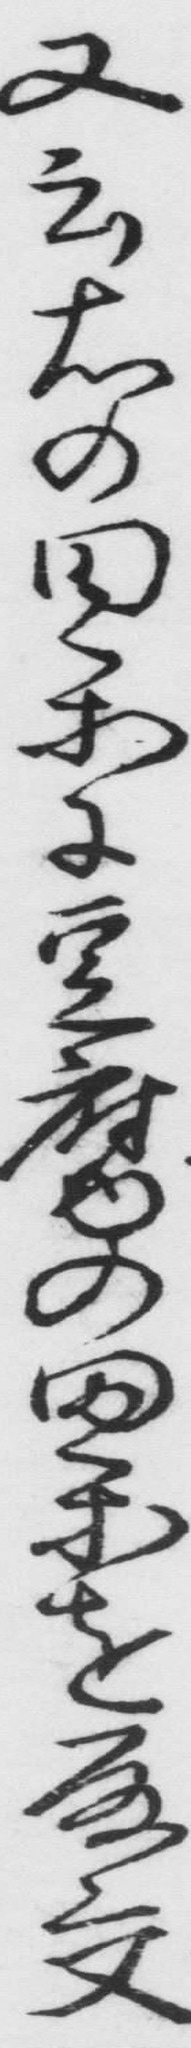又云右の田楽に豆腐の田楽を取交
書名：海鰻百珍
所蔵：大阪府立大学学術情報センター 国文学研究資料館
